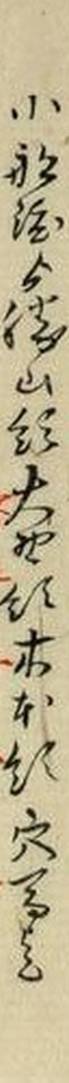小船渡ゟ勝山領大野領木本亮領穴馬迄
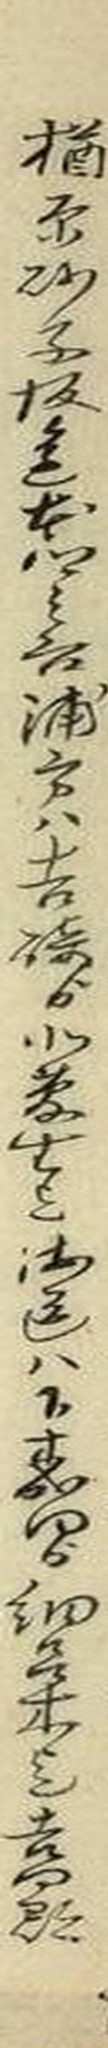楢原砂子坂辺本郷之谷浦方ハ吉崎ゟ北菅生迄海道ハ下森田ゟ細呂木迄吉田郡
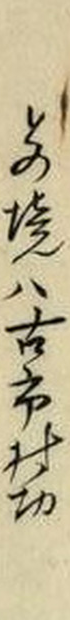との境ハ古市村切
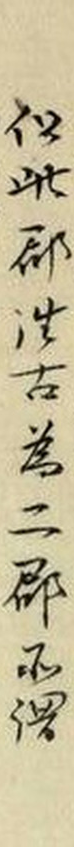但此郡往古為二郡所謂
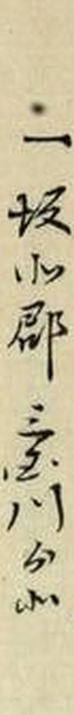一坂北郡三国川ゟ北
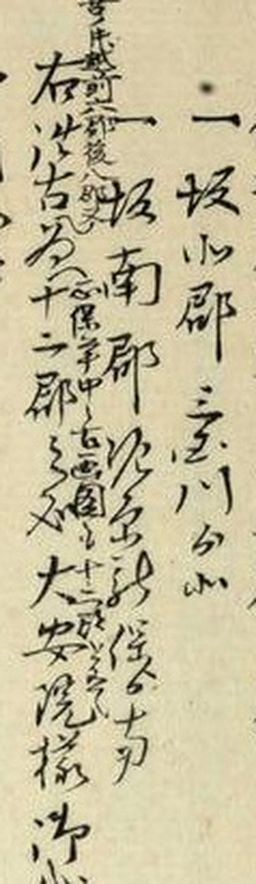一坂南郡泥原新保ゟ南
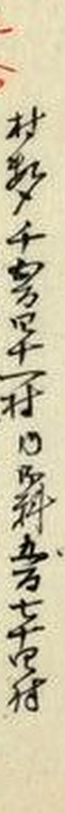村数〆千五百四十一村内御料五百七十四村
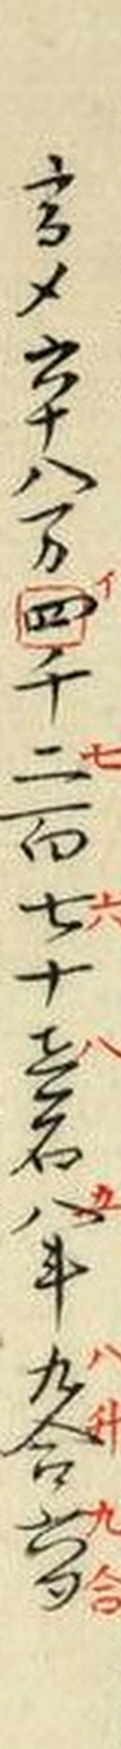高〆六十八万四千二百七十壱石八斗九合六勺
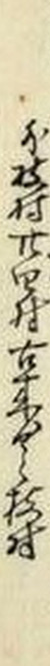外枝村廿四村古来ゟ之枝村
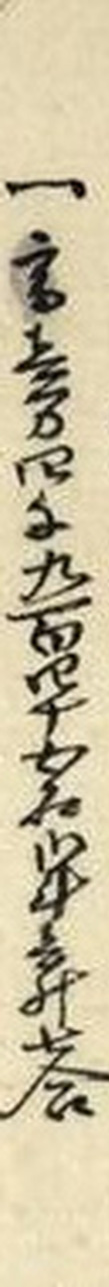一高壱万四千九百四十五石弐斗壱升七合
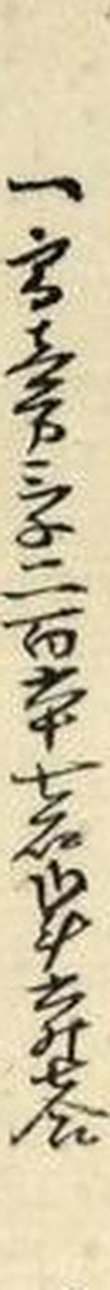一高壱万三千二百六十七石弐斗六升七合
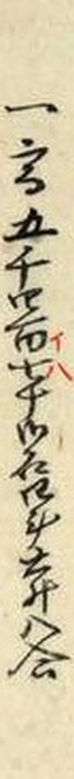一高五千四百七十弐石四斗六升八合

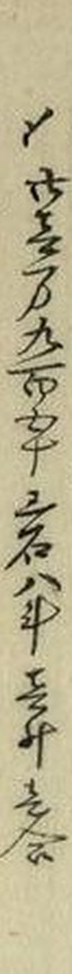〆廿壱万九百五十三石八斗壱升壱合
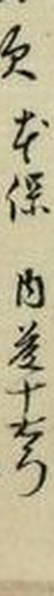公領本保内藤十右衛門
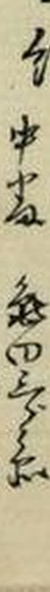中番亀田三郎兵衛
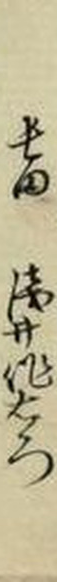長田浅井作右衛門
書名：御国他国諸事之部
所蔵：福井県文書館 Fukui Prefectural Archives
